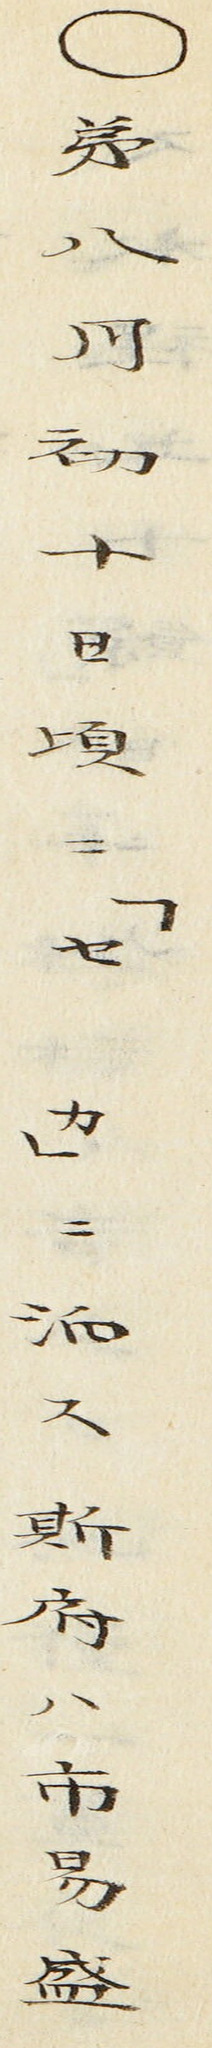〇第八月初十日頃ニ「セカ」ニ泊ス斯府ハ市易盛
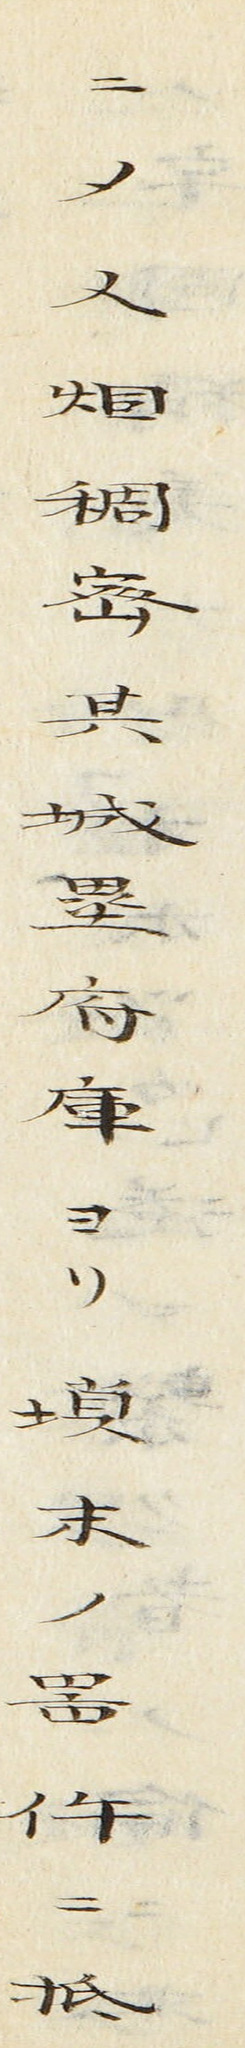ニシテ人烟稠密其城塁府庫ヨリ瑣？末ノ器件ニ抵
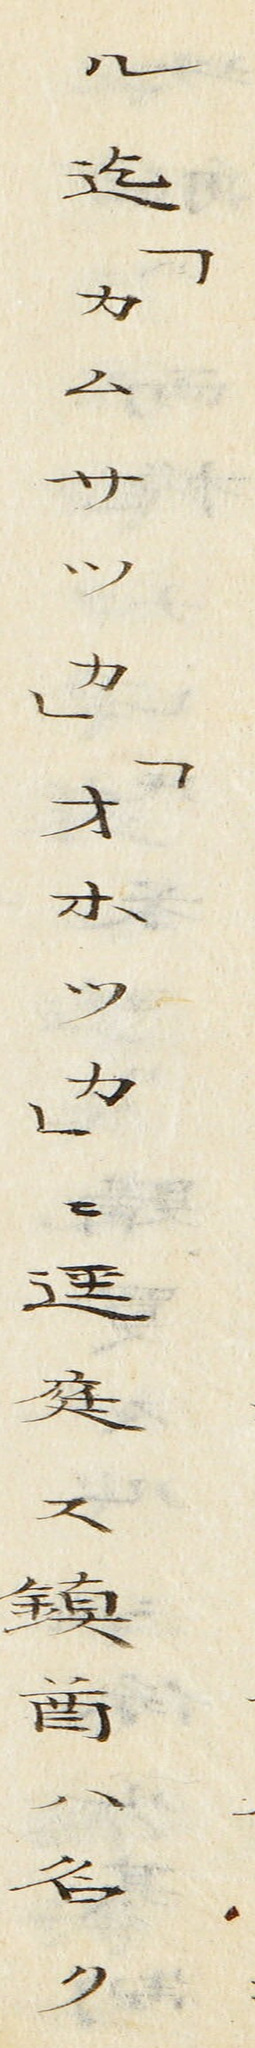ル迄「カムサツカ」「オホツカ」ニ逕庭ス鎮酋ハ名ク
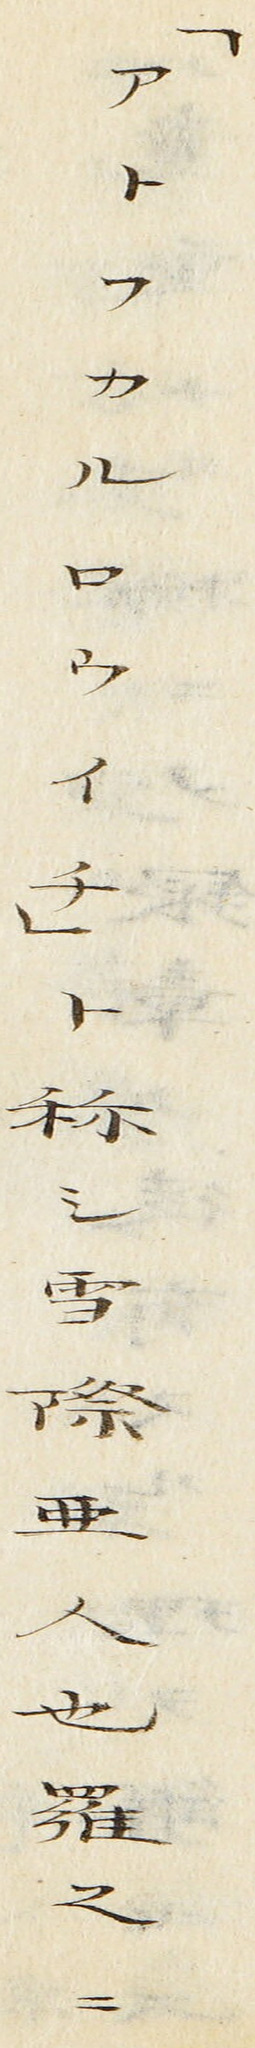「アトフカルロウイチ」ト称シ雪際亜人也羅又ニ
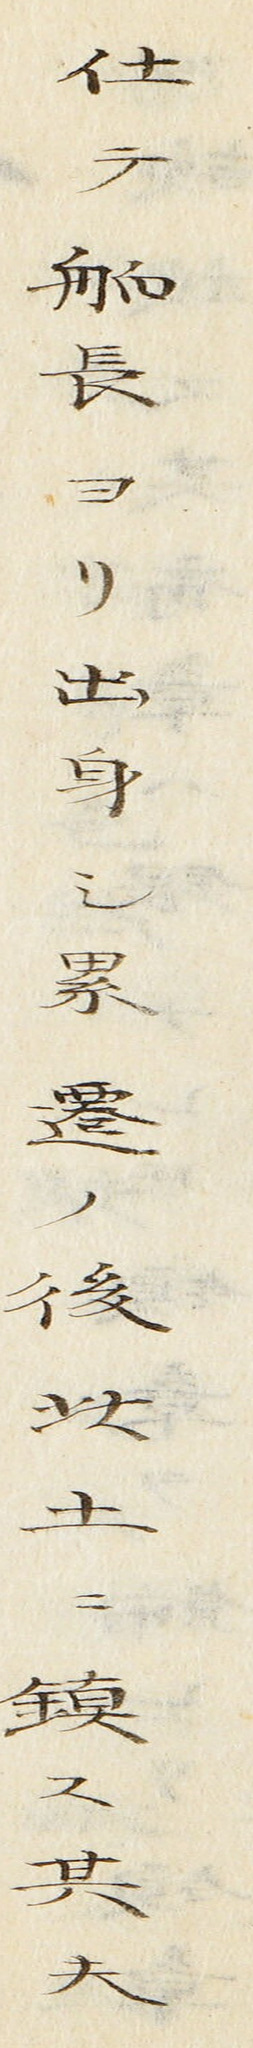仕テ舶長ヨリ出身シ累遷ノ後此土ニ鎮ス其夫
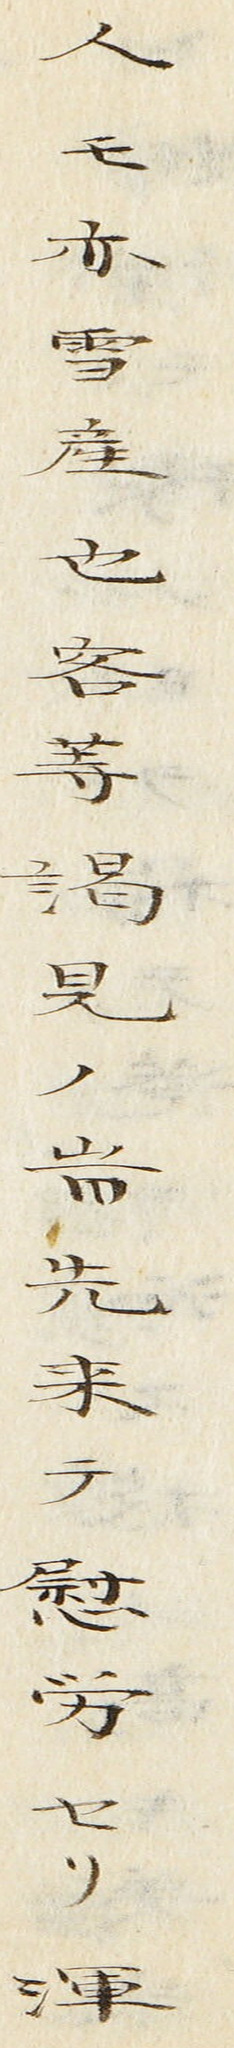人モ亦雪産也客等謁見ノ時先来テ慰労セリ渾
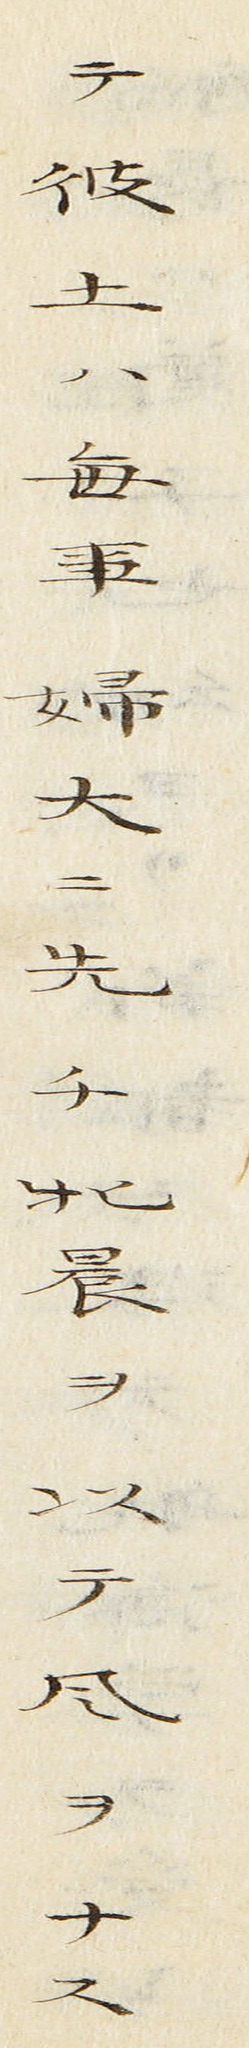テ彼土ハ毎事婦大ニ先チ牝晨ヲ以テ風トナス
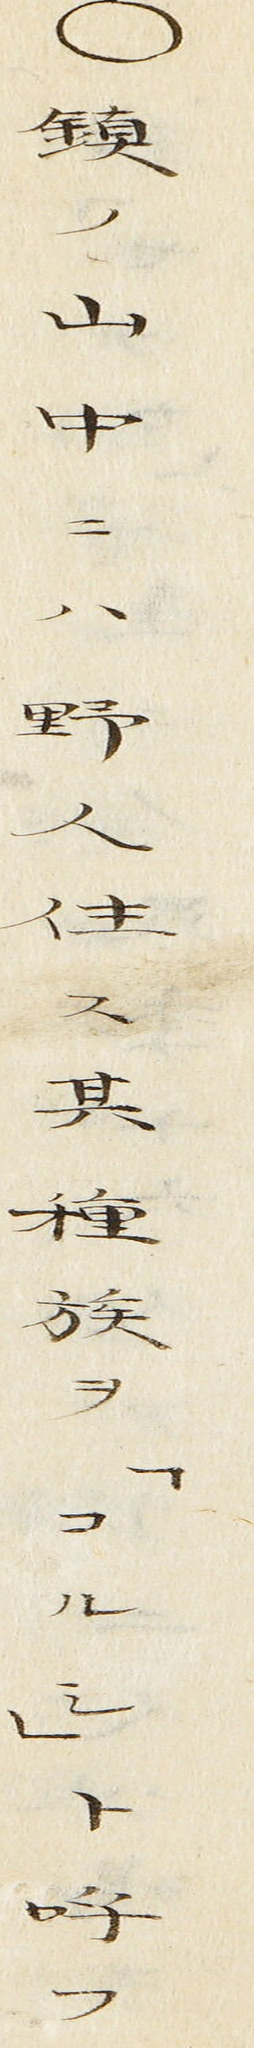〇鎮ノ山中ニハ野人住ス其種族ヲ「コルシ」ト呼フ
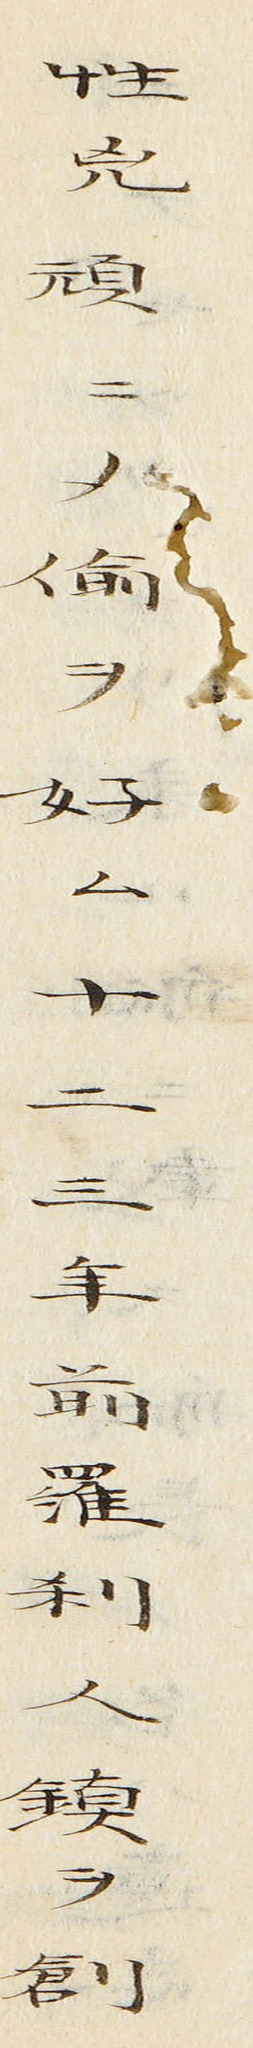性凶頑ニシテ倫ヲ好ム十二三年前羅利人鎮ヲ創
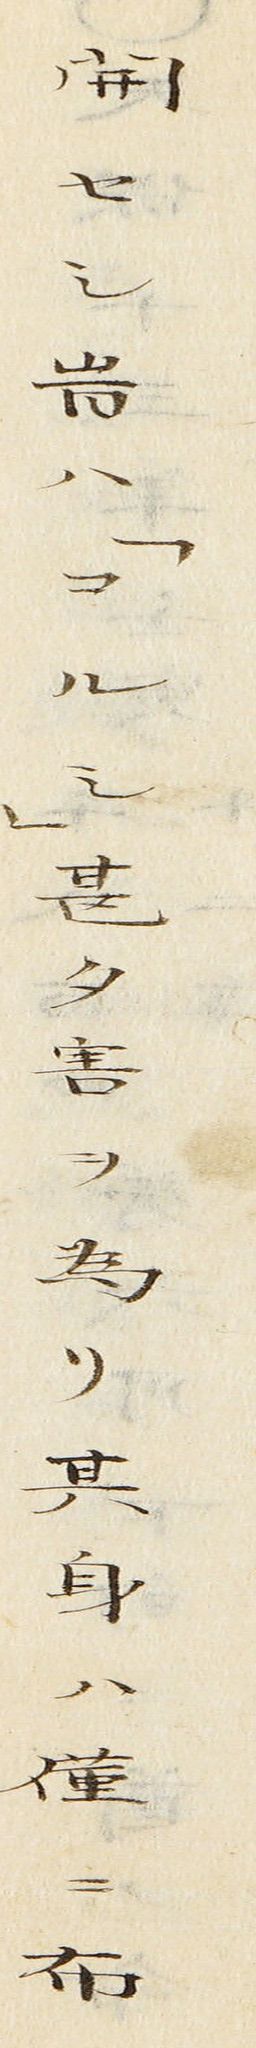開セシ時ハ「コルシ」甚タ害ヲ為リ其身ハ僅ニ布
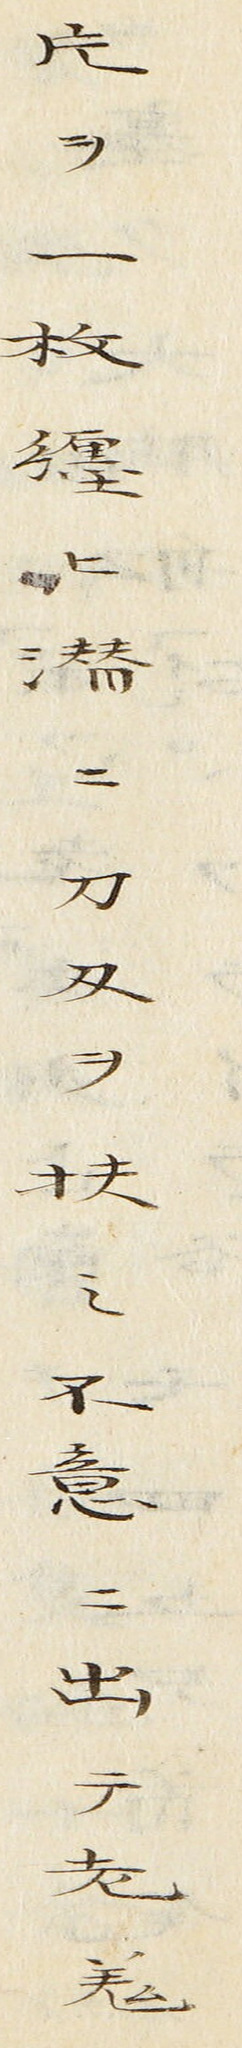片ヲ一枚纏ヒ潜ニ刀刃ヲ扶ミ不意ニ出テ老羗
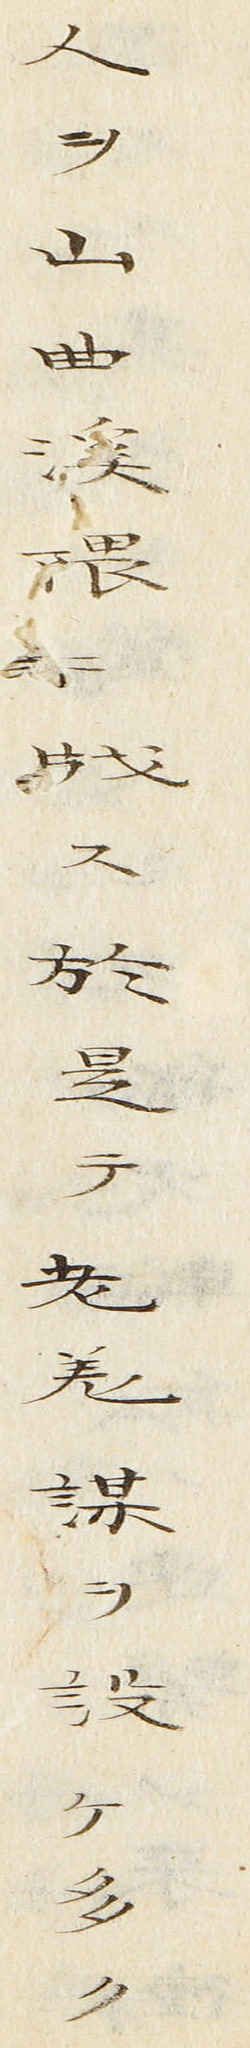人ヲ山曲渓隈ニ戕ス於是テ老羗謀ヲ設ケ多ク
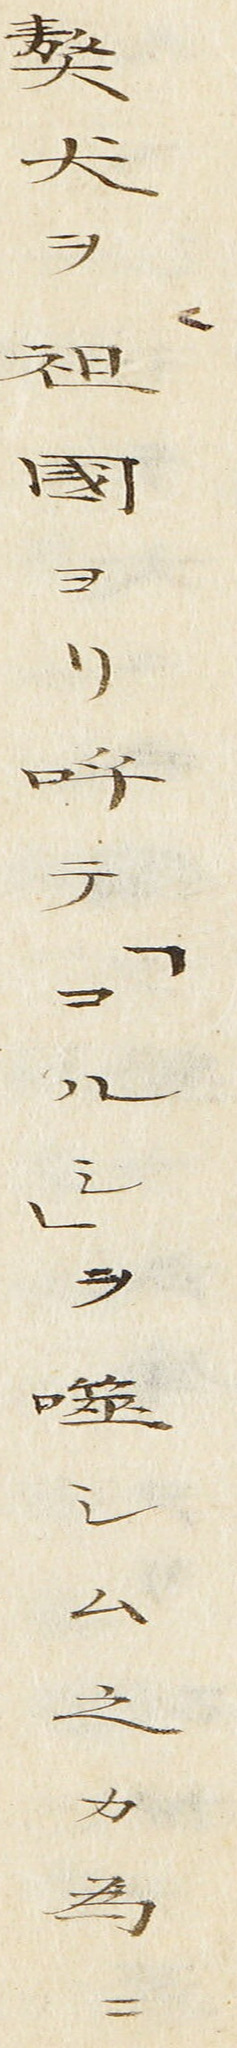獒犬ヲ祖国ヨリ呼テ「コルシ」ヲ噬シム之カ為ニ
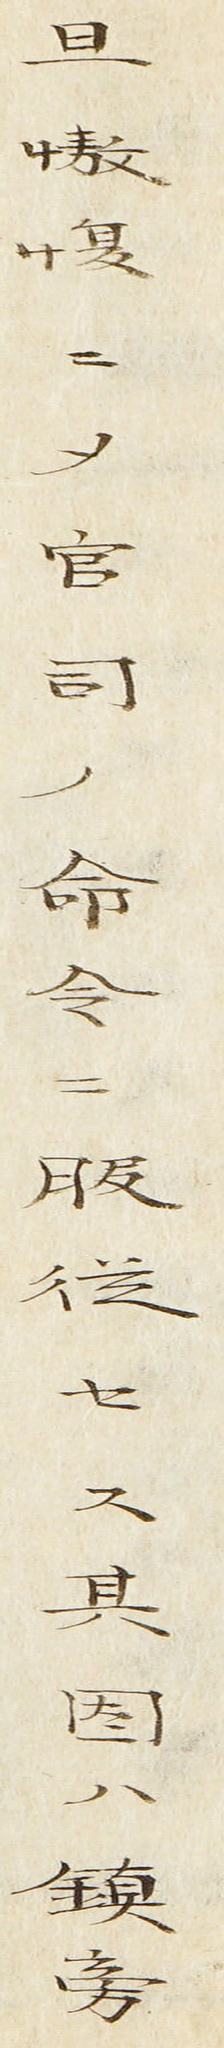旦慠愎ニシテ官司ノ命令ニ服従セス其因？ハ鎮旁
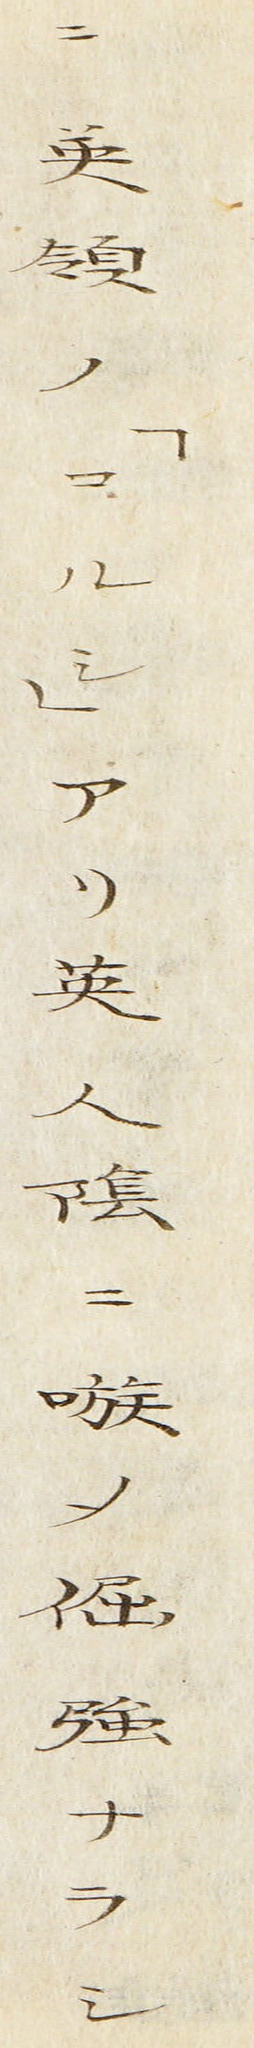ニ英領ノ「コルシ」アリ英人陰ニ嗾シテ倔強ナラシ
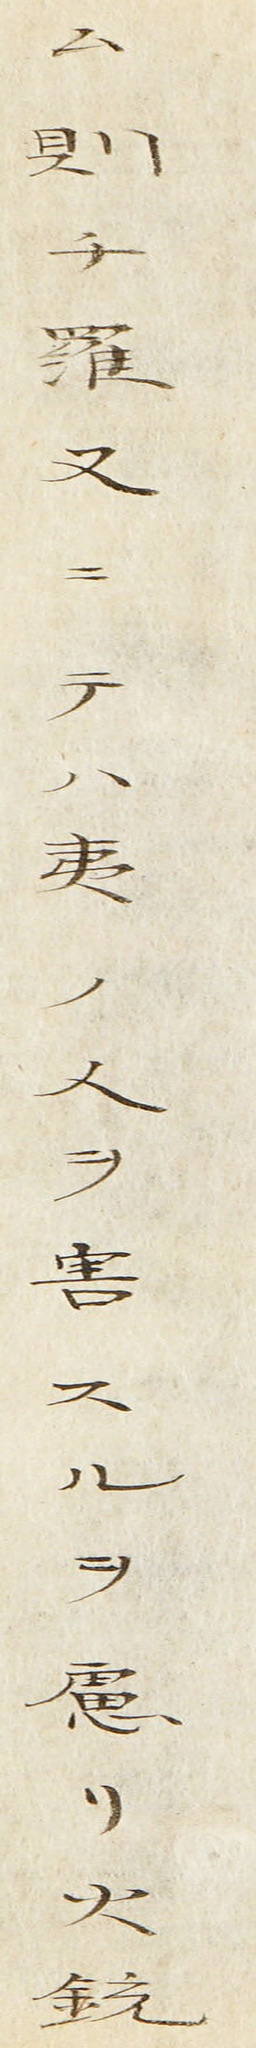ム則チ羅又ニテハ夷ノ人ヲ害スルヲ慮リ火銃
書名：蕃談
